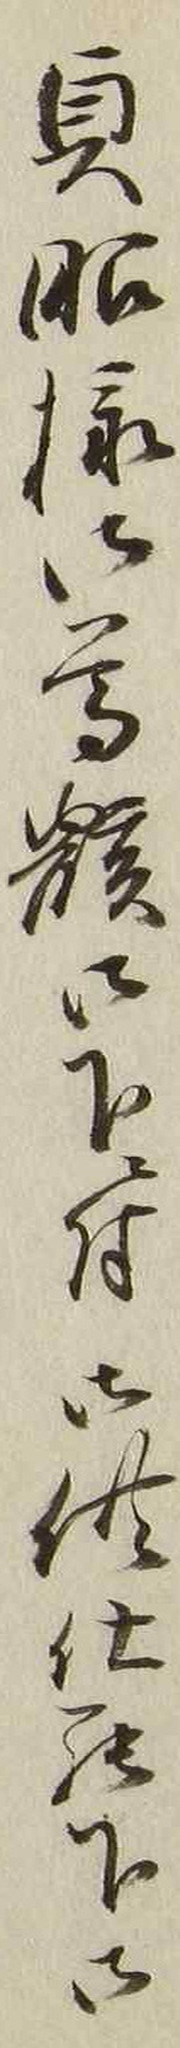貞昭様御尊骸御下ニ付御供仕罷下御
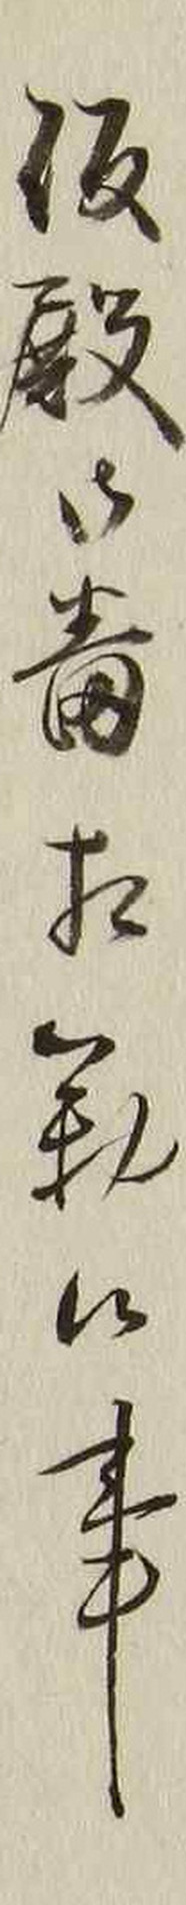仮殿御番相勤候事
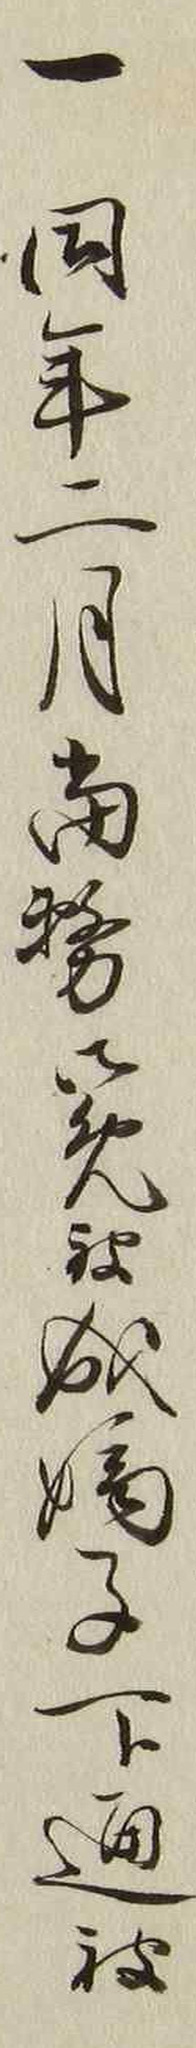一同年二月当務御免被成嫡子下通被
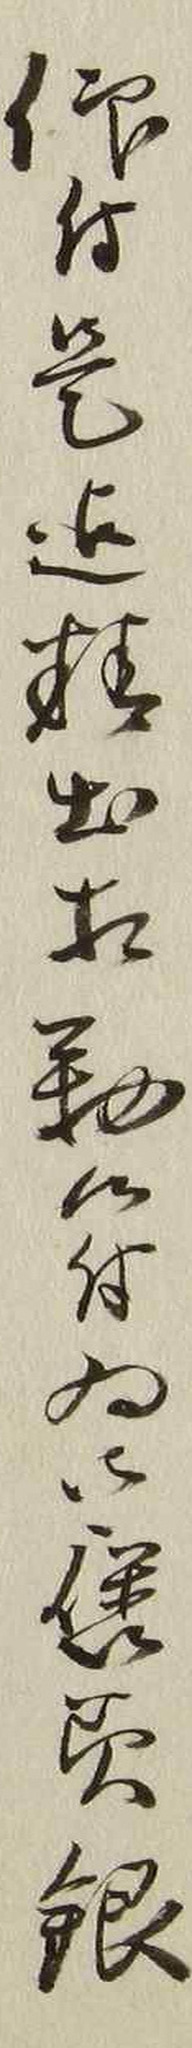仰付是迄精出相勤候付為御褒美銀
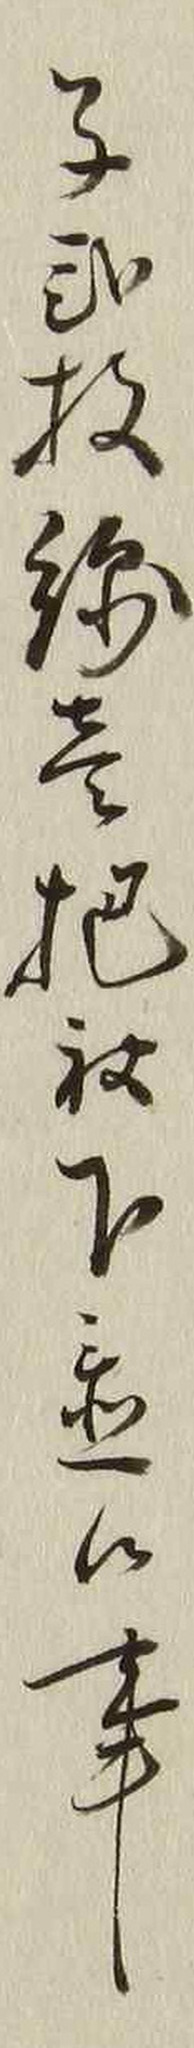子弐枚綿壱把被下置候事
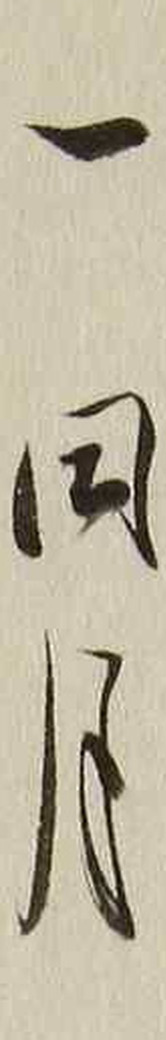一同月
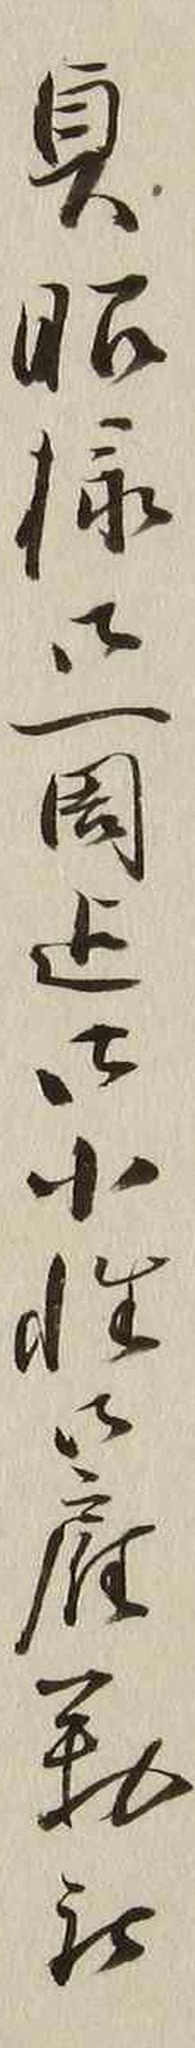貞昭様御一周迄御小性御雇勤被
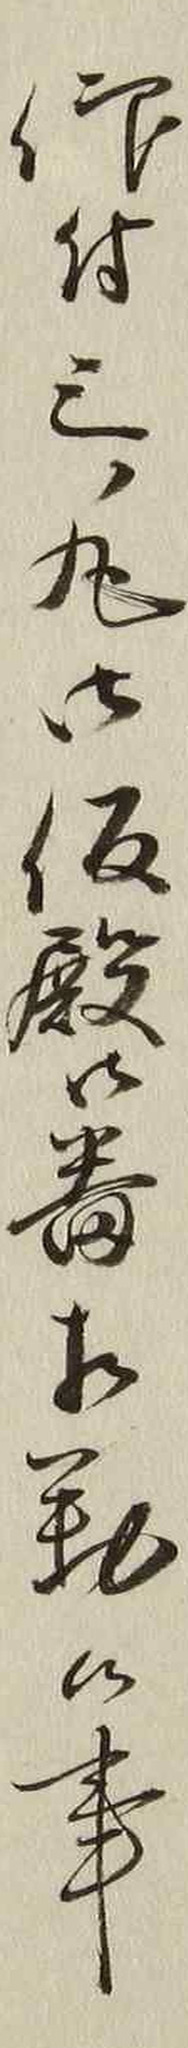仰付三ノ丸御仮殿御番相勤候事
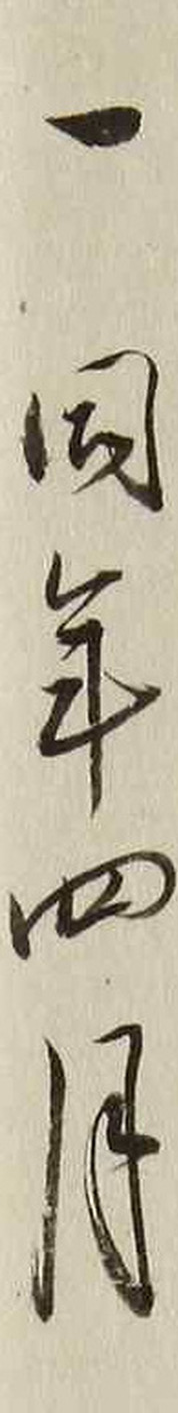一同年四月
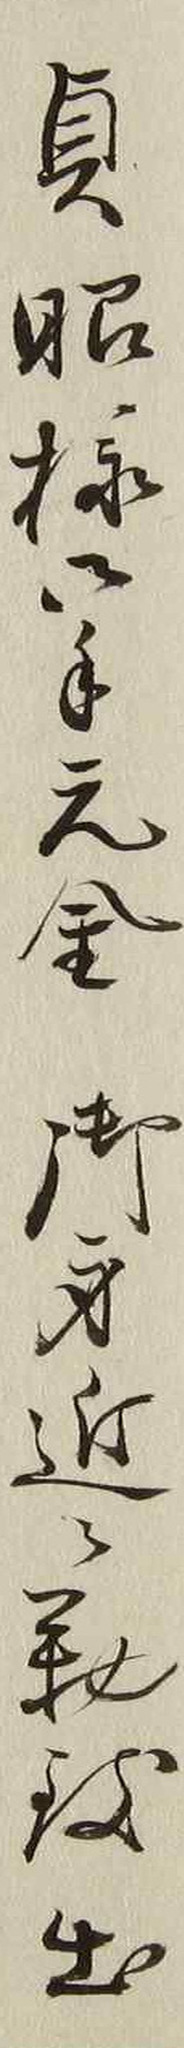貞昭様御手元金御身近ニ勤致出
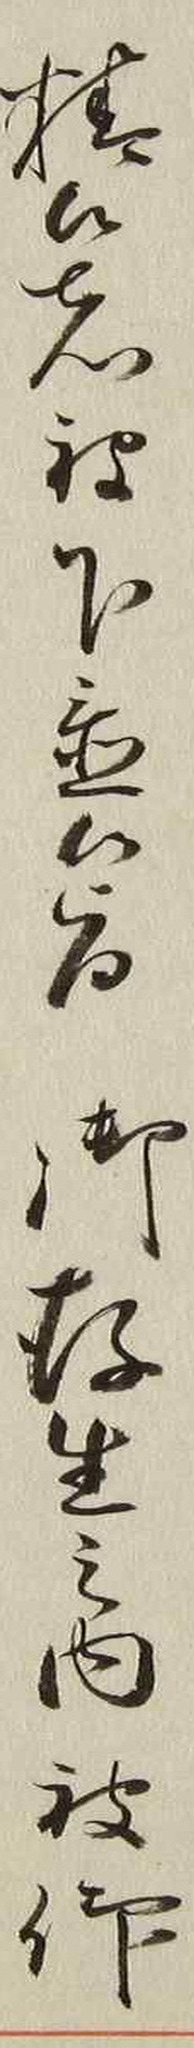精候者被下置候旨御存生之内被仰
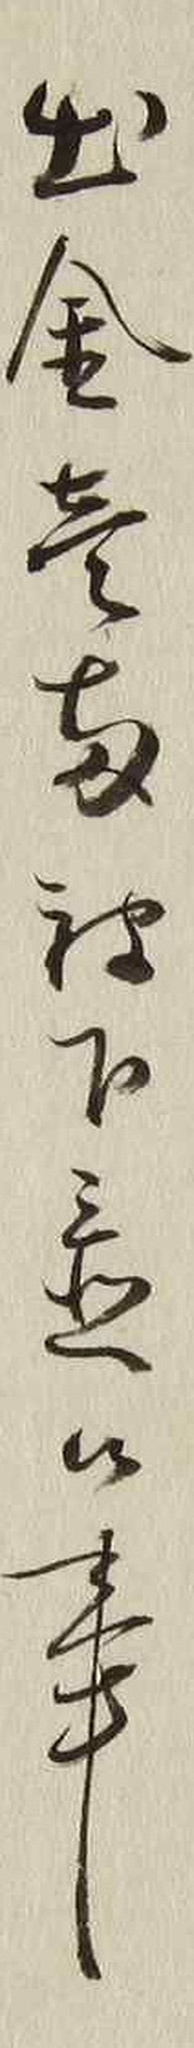出金壱両被下置候事
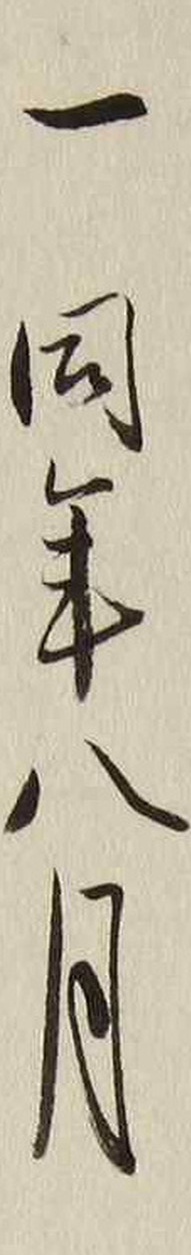一同年八月
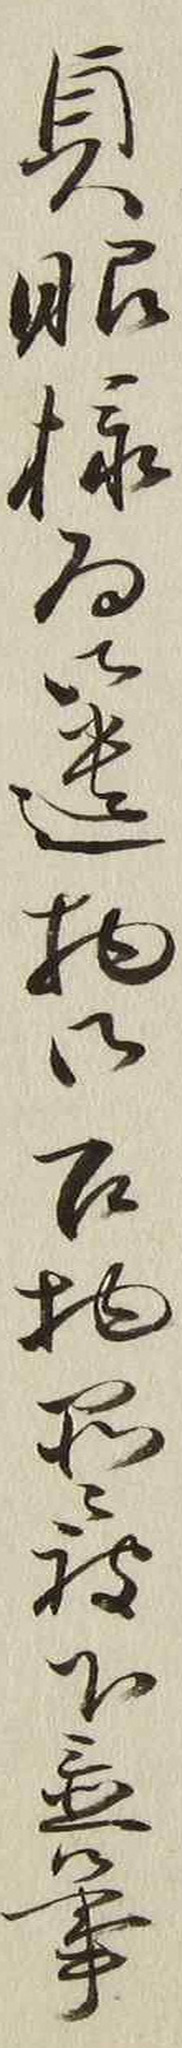貞昭様為御遺物御召物品々被下置候事
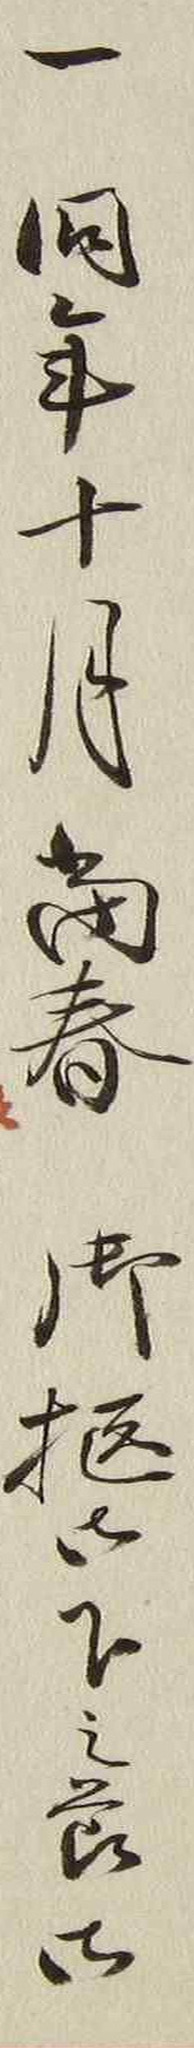一同年十月当春御柩御下之節御
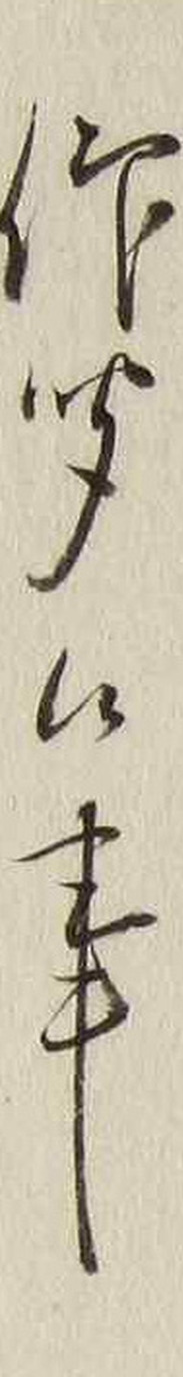仰聞候事
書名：諸士系譜　巻之163　な之部5
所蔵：会津若松市立会津図書館
